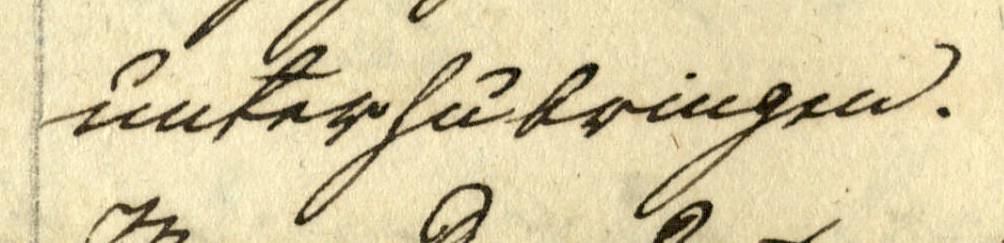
unterzubringen.
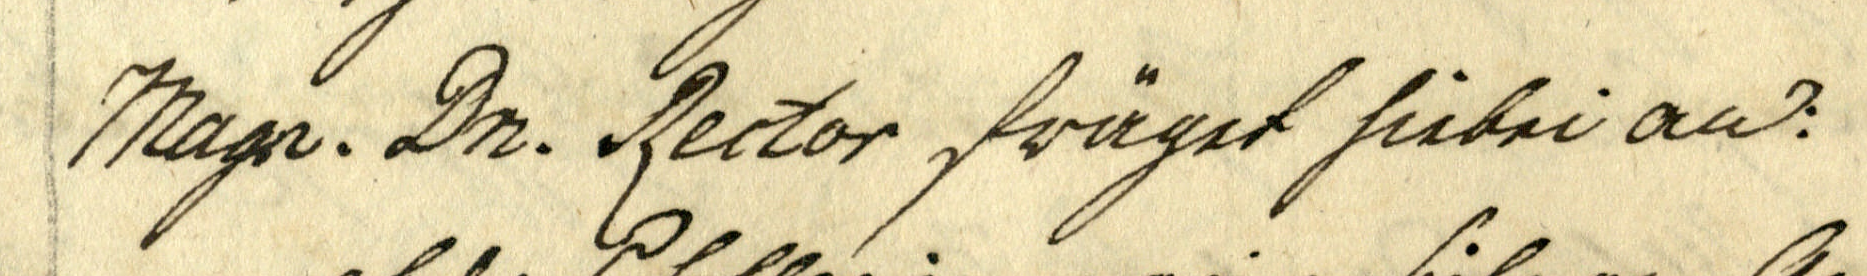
Magn. Dn. Rector fräget hiebei an:
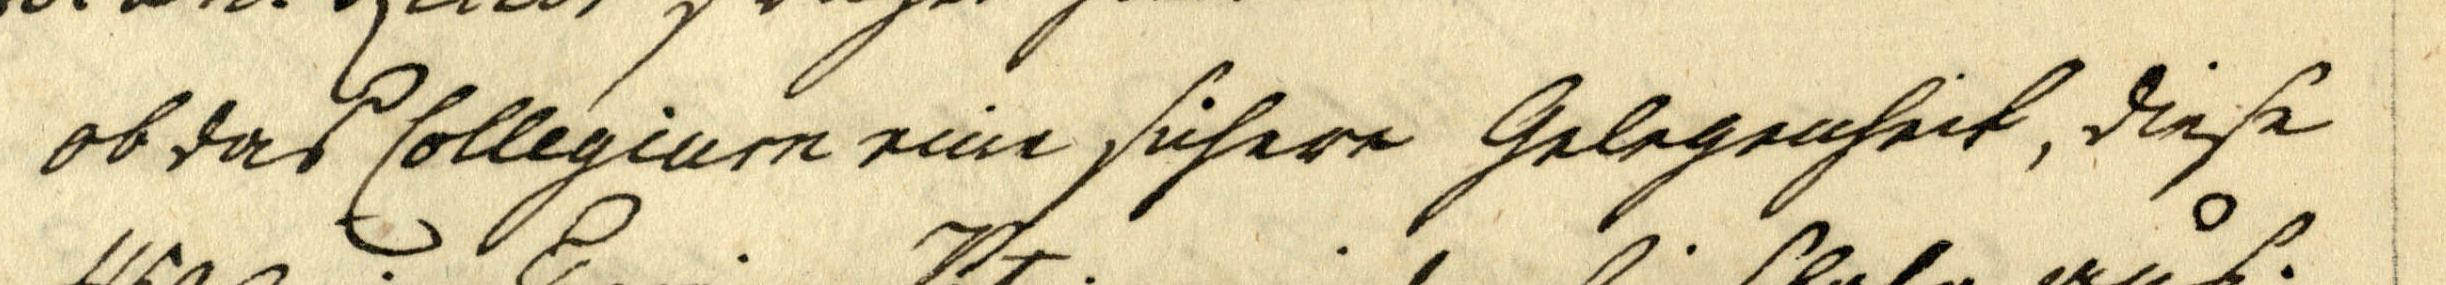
ob das Collegium eine sichere Gelegenheit, diese
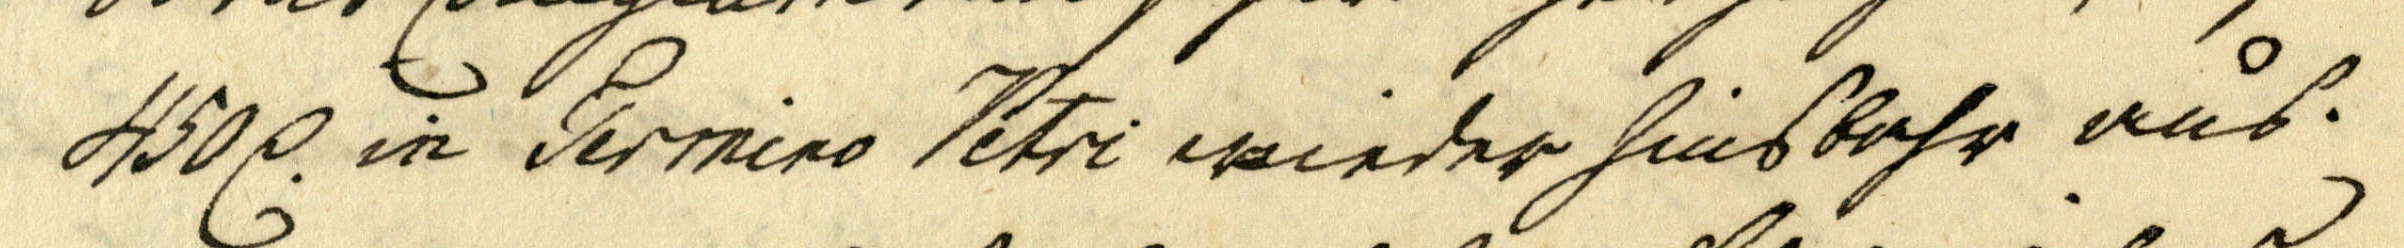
450 l. in Termino Petri wieder zinsbahr aus¬
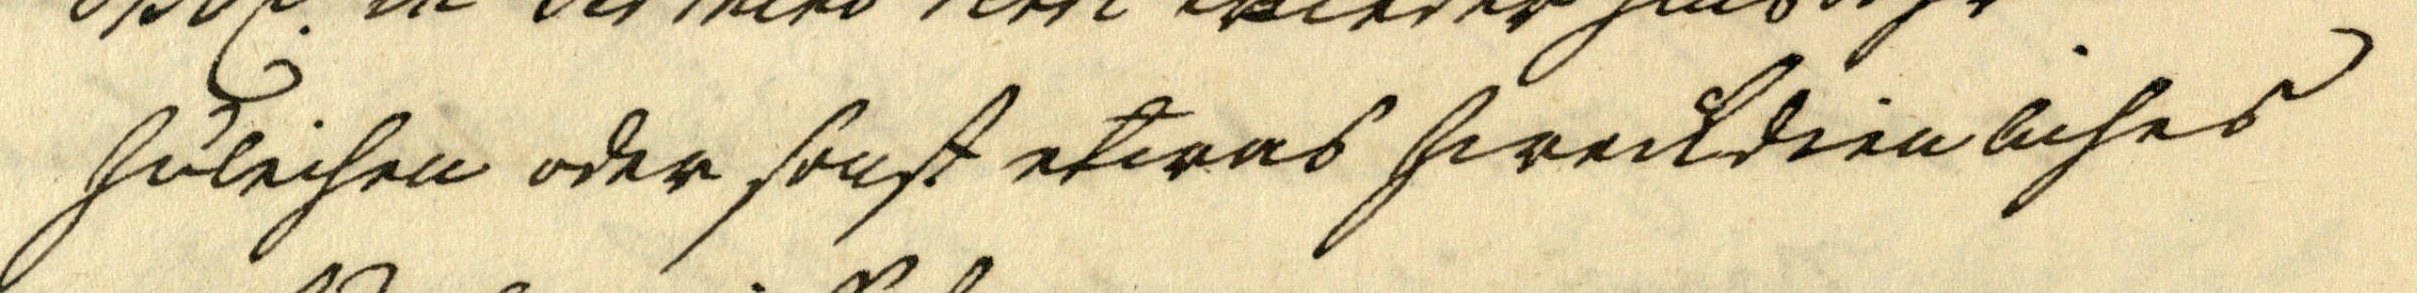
zuleihen der sonst etwas zweckdienliches
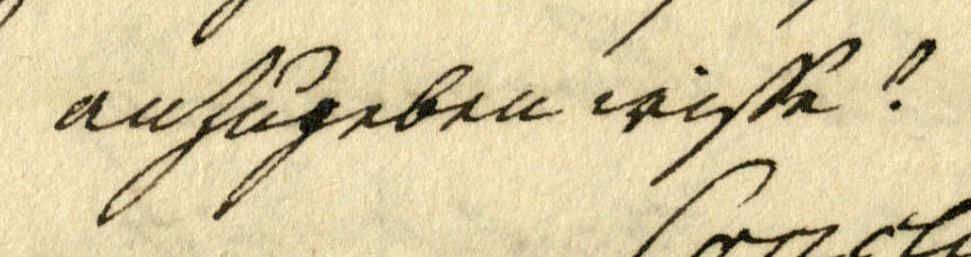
anzugeben wisse?
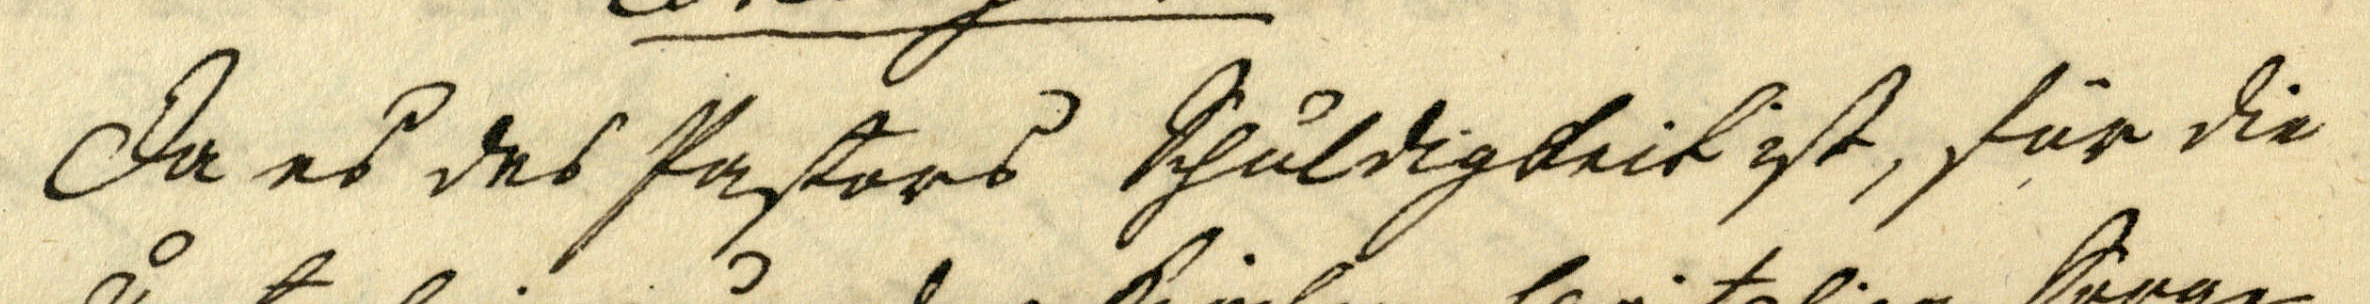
Da es des Pastors Schuldigkeit ist, für die
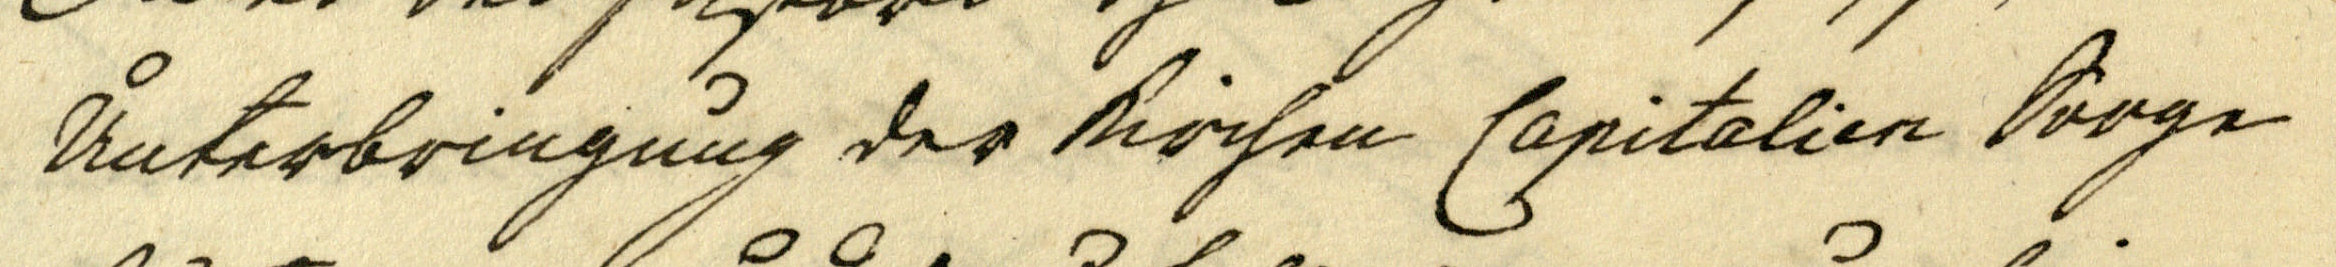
Unterbringung der Kirchen Capitalien Sorge
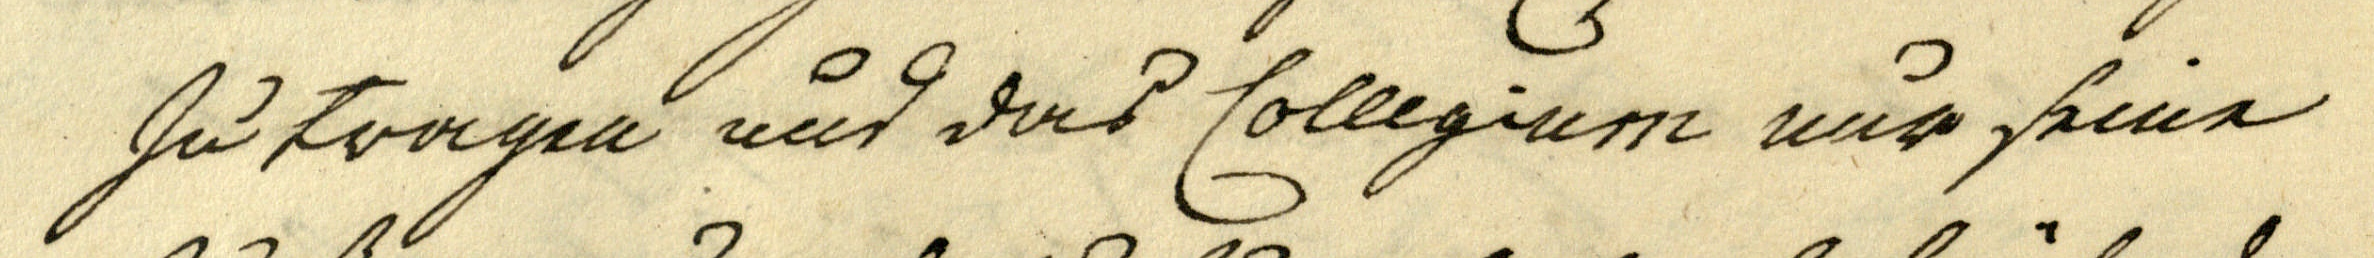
zu tragen und das Collegium nur seine
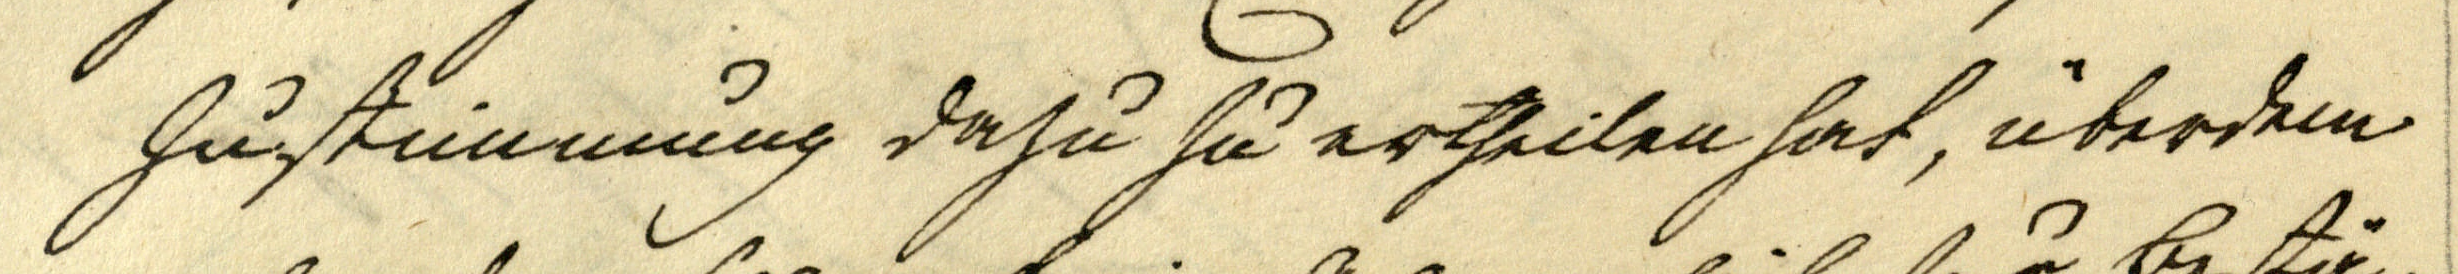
Zustimmung dazu zu ertheilen hat, überdem
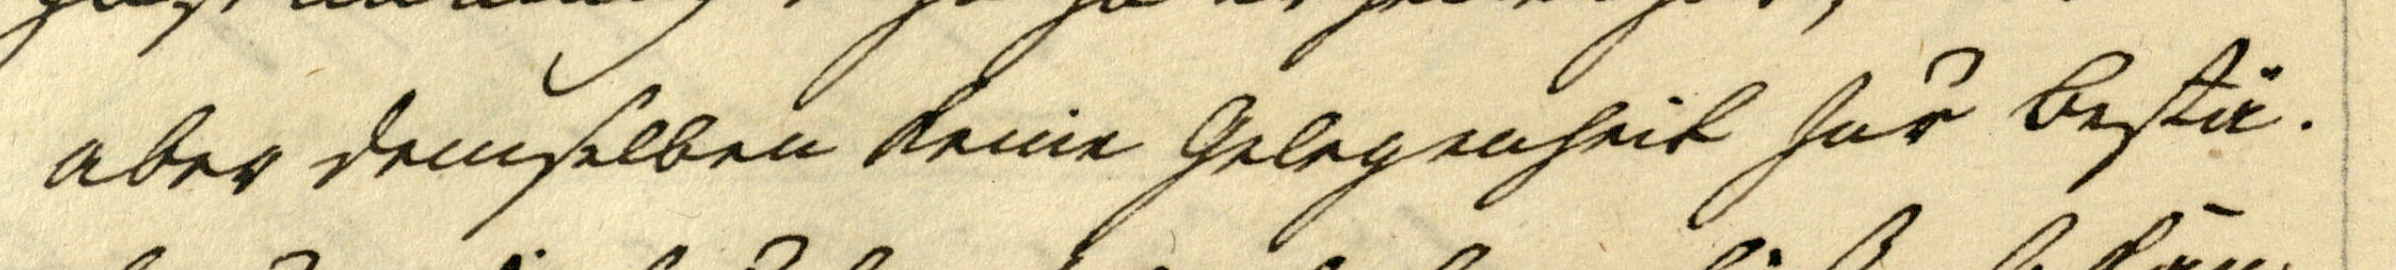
aber demselben keine Gelegenheit zur Bestä¬
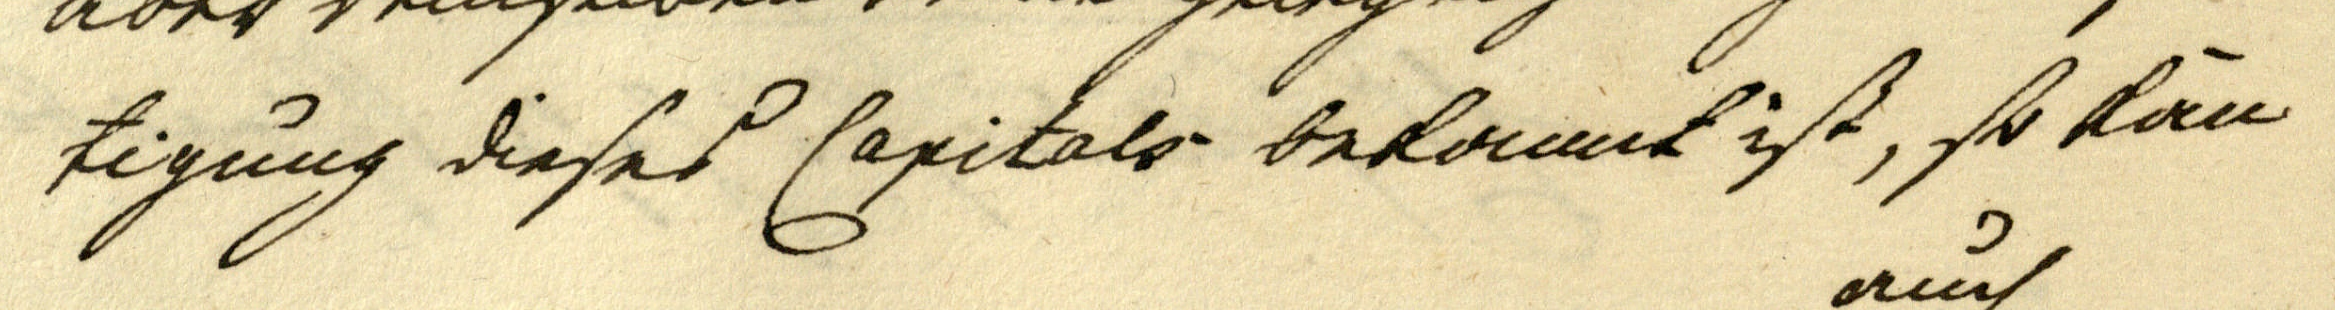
tigung dieses Capitals bekannt ist, so kan
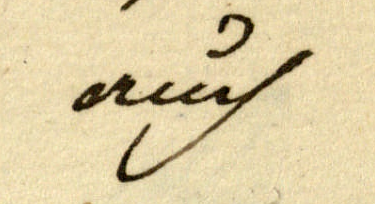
auch
